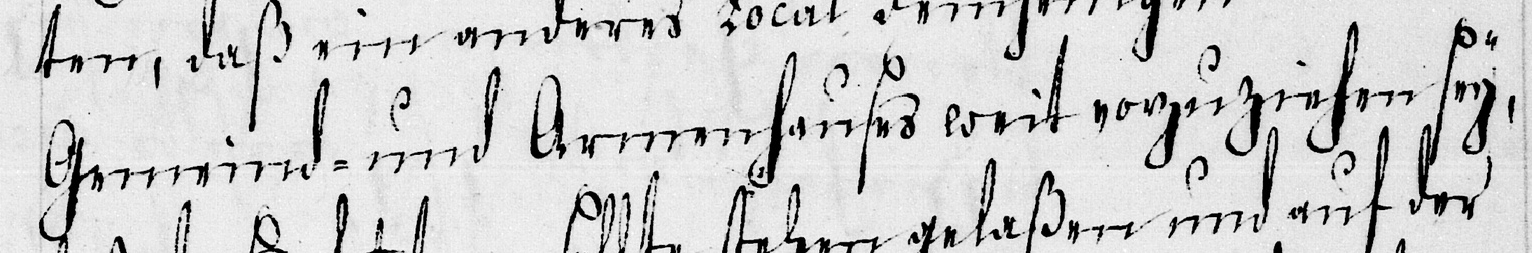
Gemeind- und Armenhauses weit vorzuziehen sey,
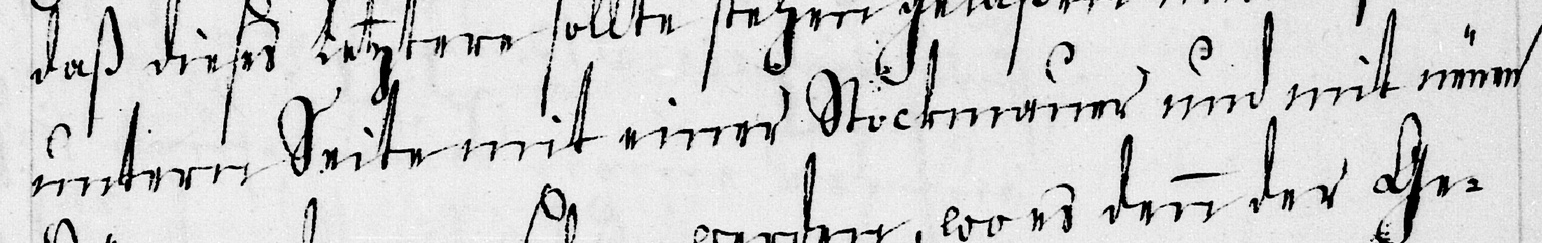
untern Seite mit einer Stockmauer und mit neuen
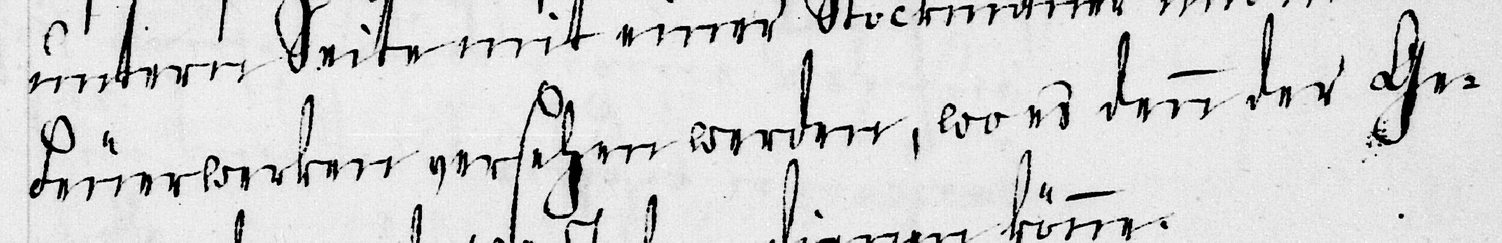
Feuerwerken versehen werden, wo es denn der Ge¬
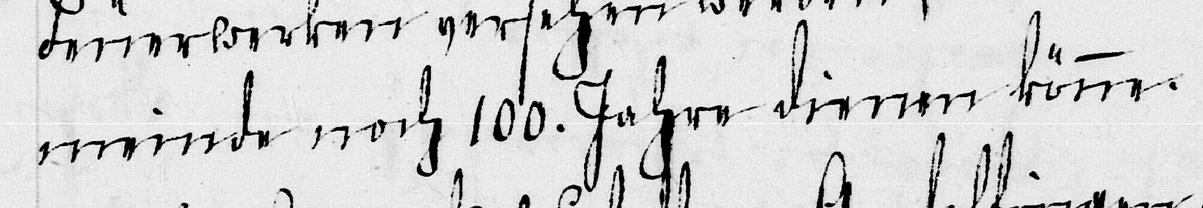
meinde noch 100. Jahre dienen könne.
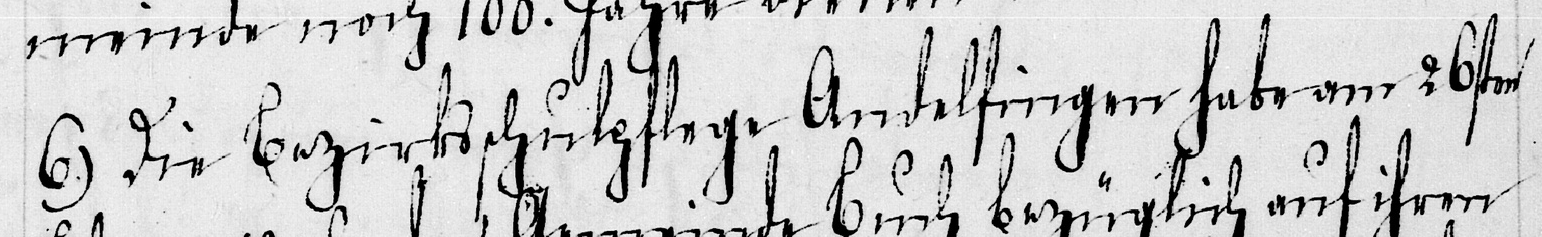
6.) Die Bezirksschulpflege Andelfingen habe am 26ten
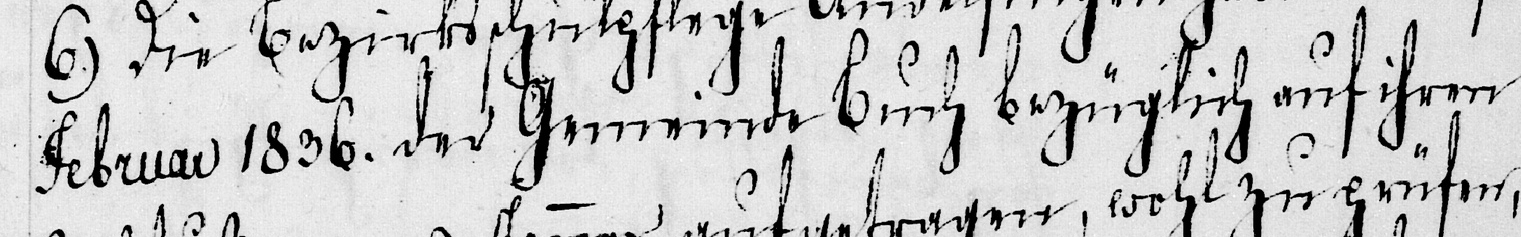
Februar 1836. der Gemeinde Buch bezüglich auf ihren
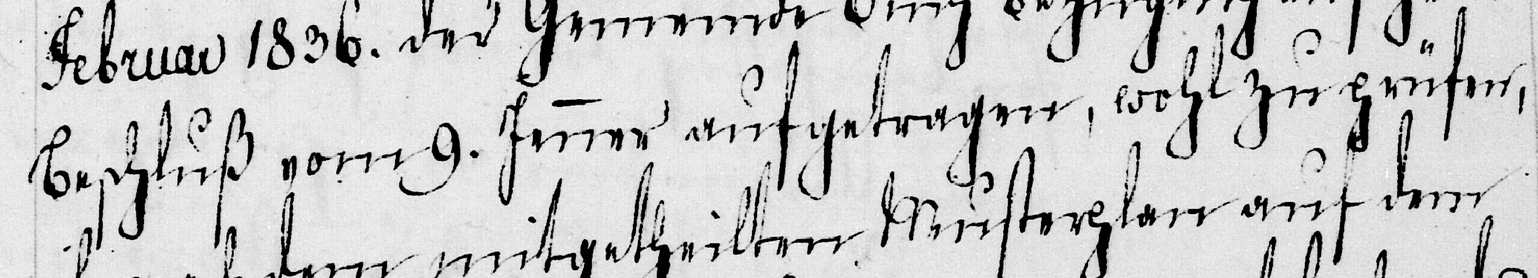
Beschluß vom 9. Jenner aufgetragen, wohl zu prüfen,
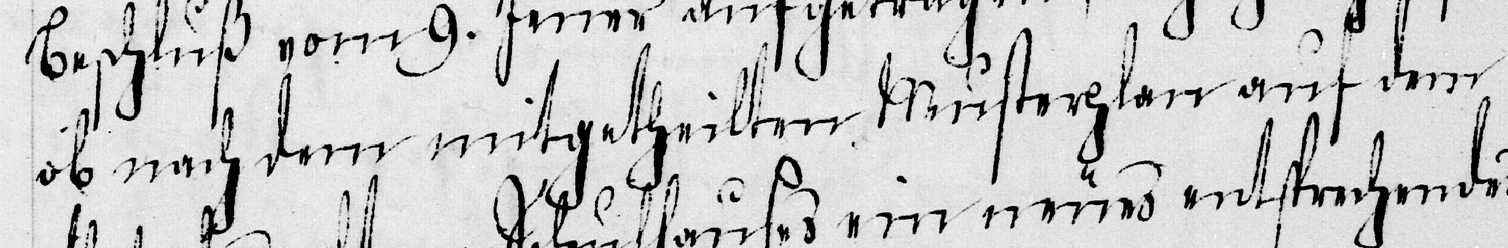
ob nach dem mitgetheilten Musterplan auf dem
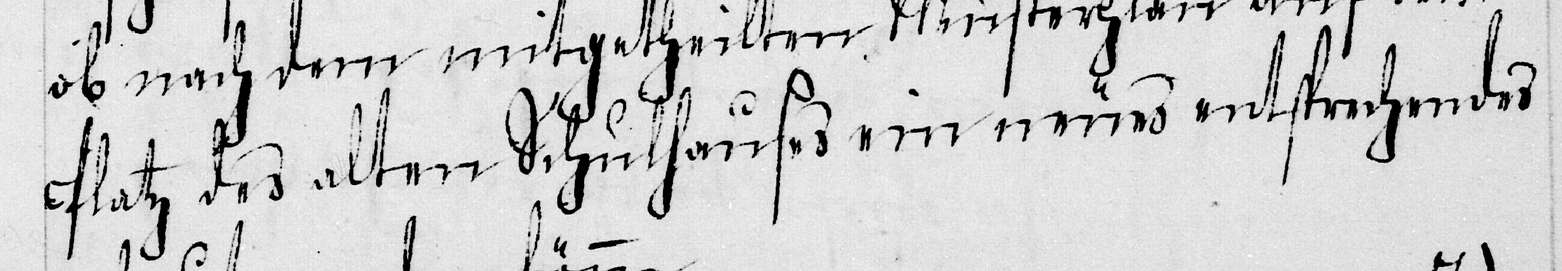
Platz des alten Schulhauses ein neues entsprechendes
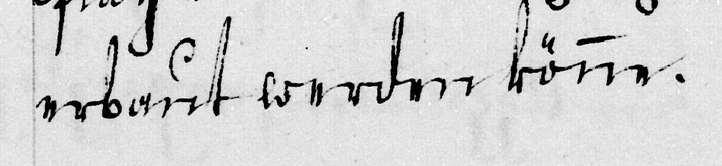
erbaut werden könne.
